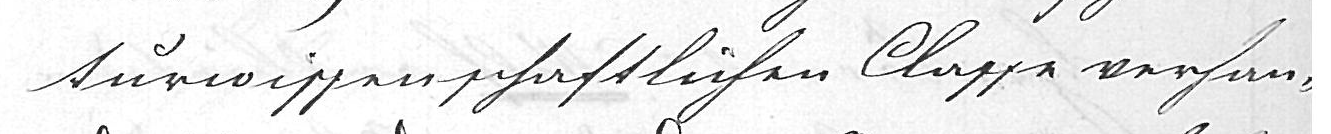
turwissenschaftlichen Classe verhan-
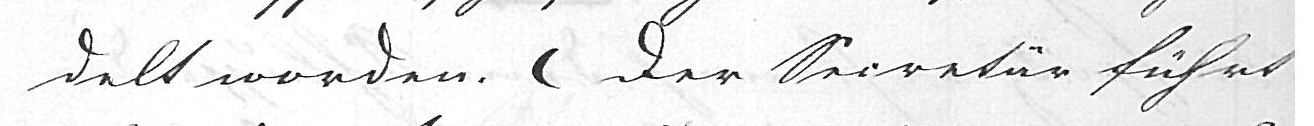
delt worden. (Der Secretär führt
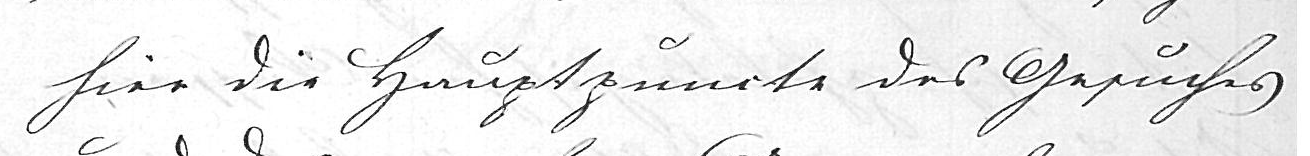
hier die Hauptpuncte des Gesuches
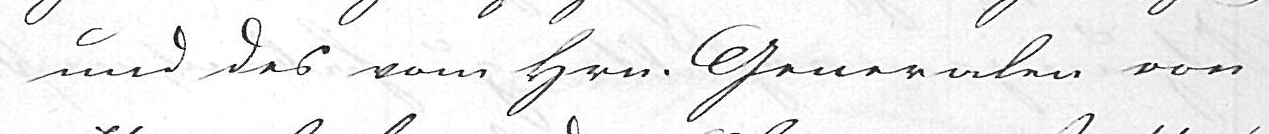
und des vom Herrn Generalen von
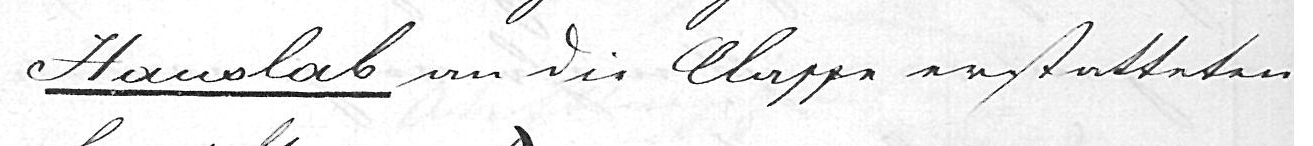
Hauslab an die Classe erstatteten
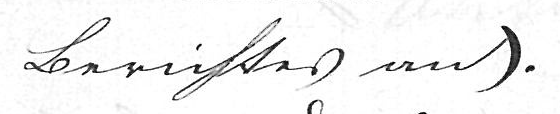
Berichtes an).
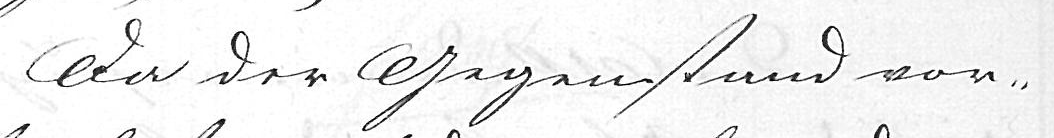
Da der Gegenstand vor-
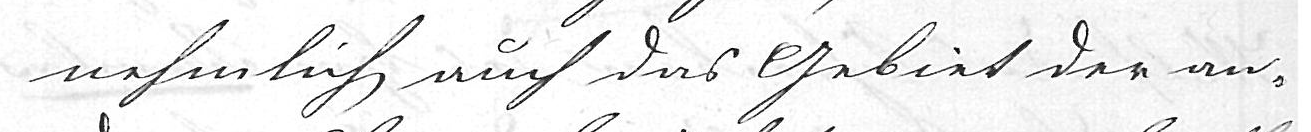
nehmlich auch das Gebiet der an-
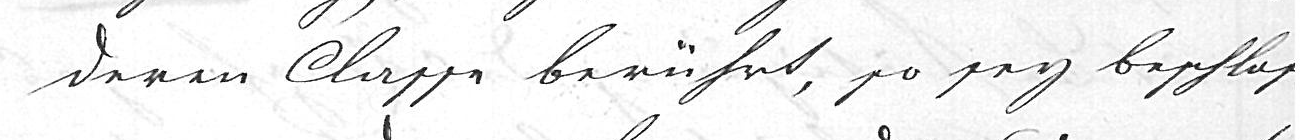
deren Classe berührt, so sey beschlos-
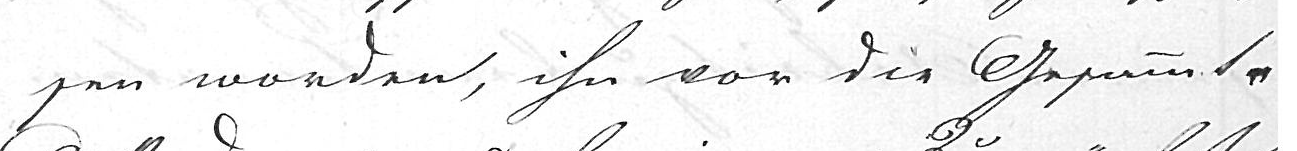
sen worden, ihn vor die Gesammt-
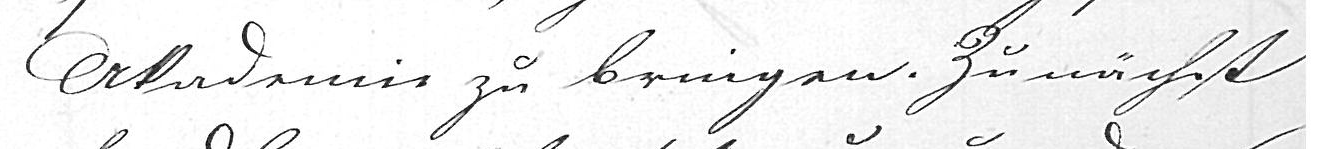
Akademie zu bringen. Zunächst
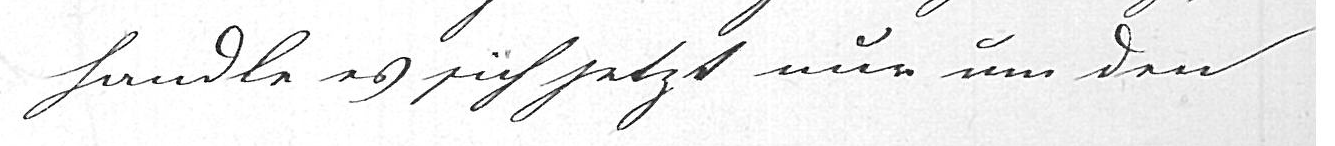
handle es sich jetzt nur um den
